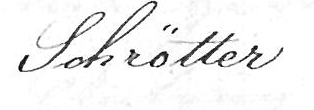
Schrötter
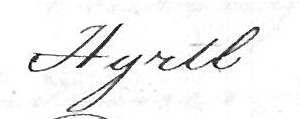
Hartl
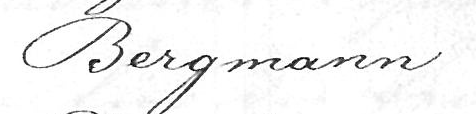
Bergmann
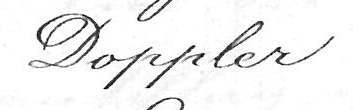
Doppler
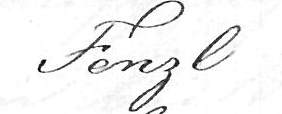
Fenzl
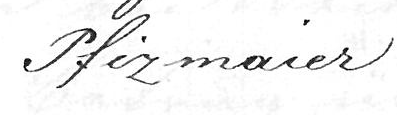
Pfizmaier
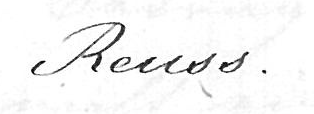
Reuss
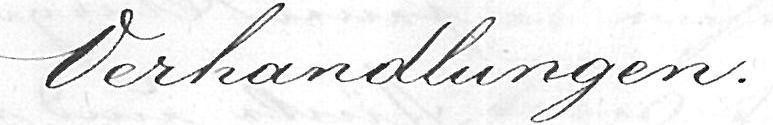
Verhandlungen.
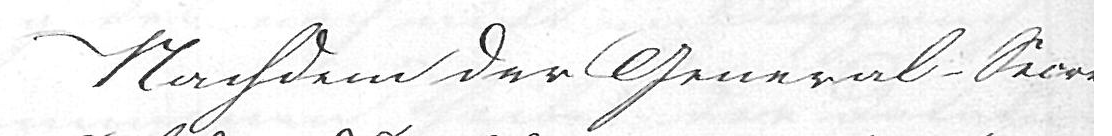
Nachdem der General-Secre-
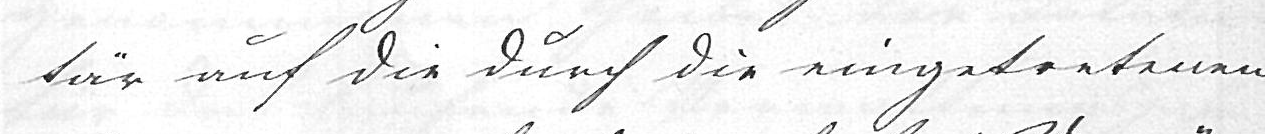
tär auf die durch die eingetretenen
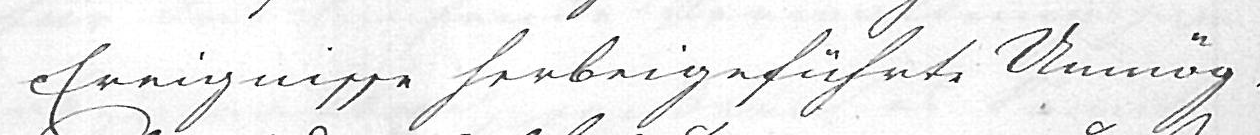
Ereignisse herbeigeführte Unmög-
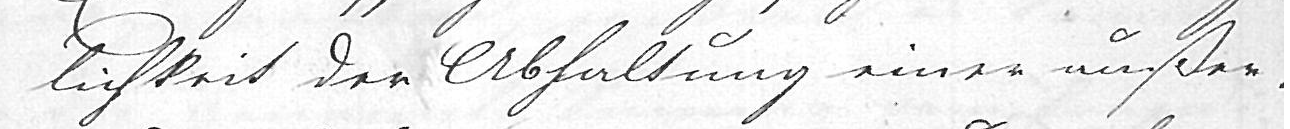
lichkeit der Abhaltung einer außer-
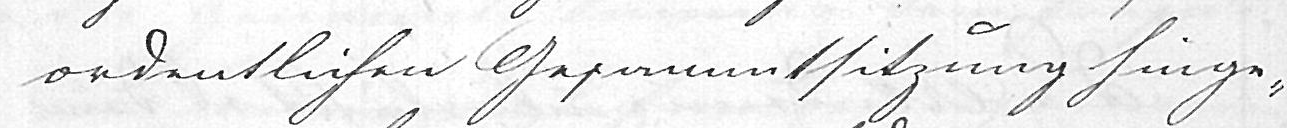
ordentlichen Gesammtsitzung hinge-
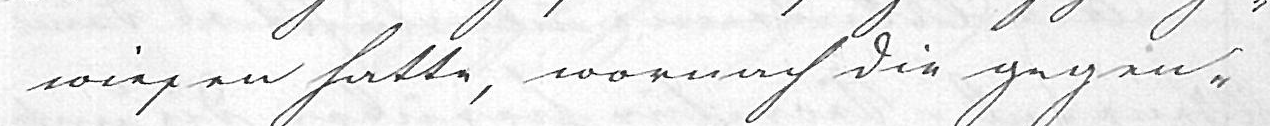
wiesen hatte, wornach die gegen-
